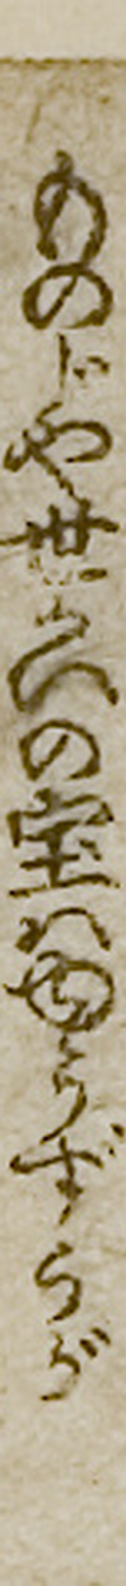ものじや世かいの宝はゆうずうが
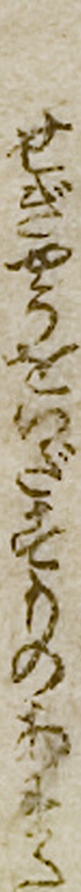せぎやうをいだすものあまた
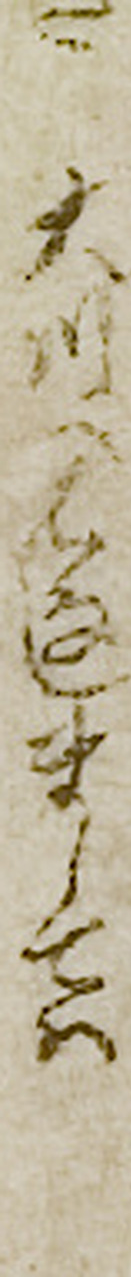大川へはなしましては
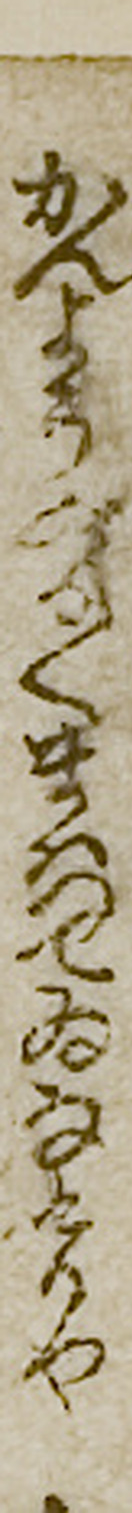かんようだかくまいつてゐなけりや
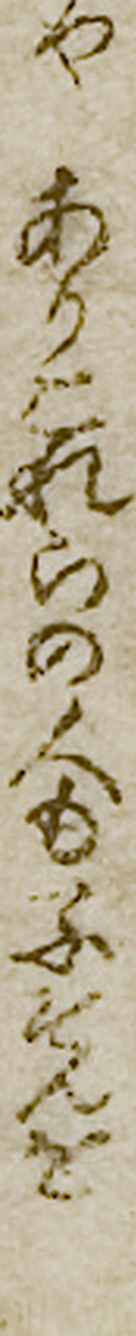ありこれらの人もふん
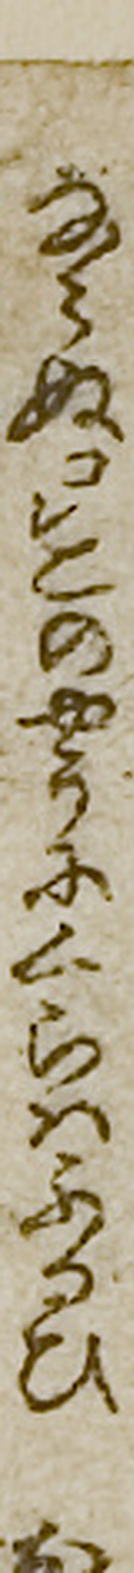ならぬこれこのやうにくらいふるひ
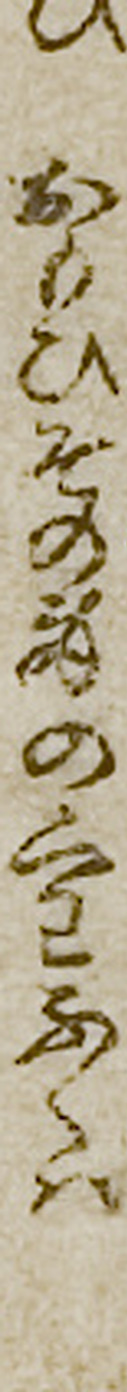おもひその身のくわふくは
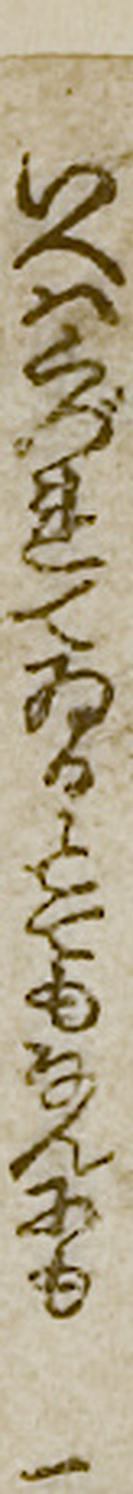いへはくづれてゐるとてもなんにも
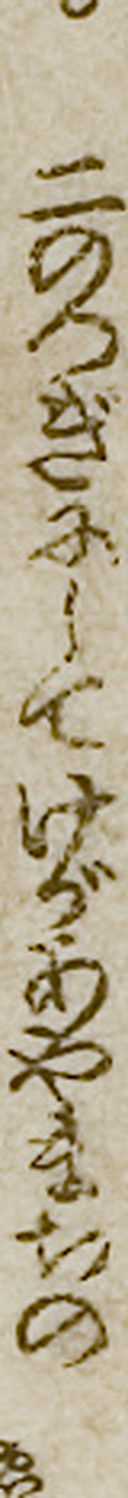二のつぎにしてけがあやまちの
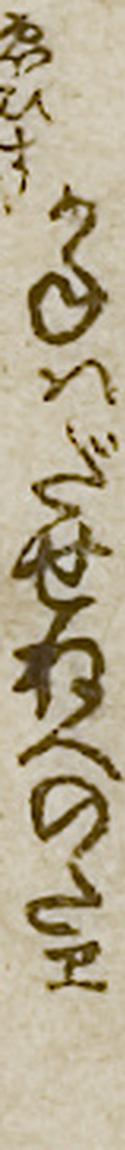かねはだせねへのだゑ
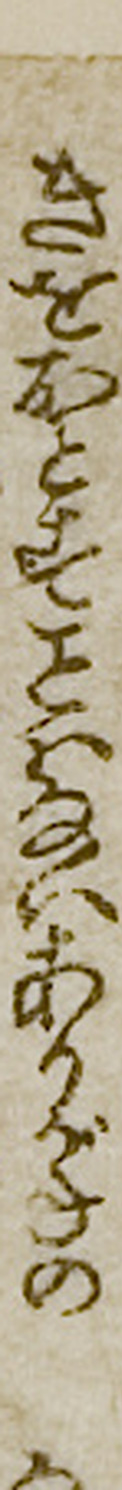きをおとすことはないありがねの
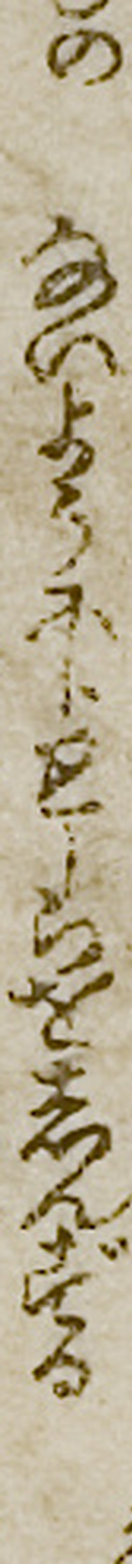ないようにしらをしんじる
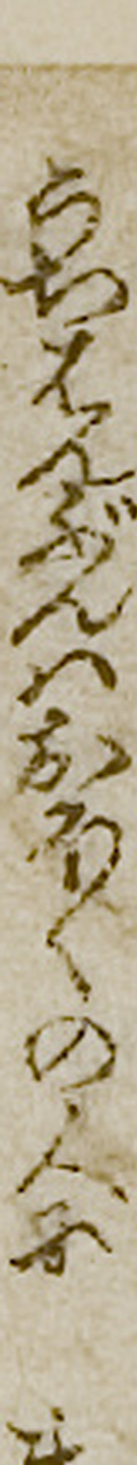うちはんぶんはおほくの人に
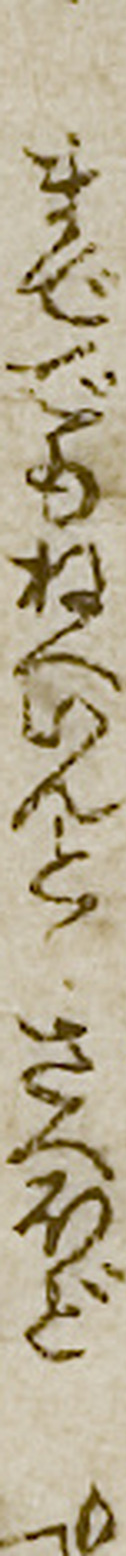まででもねへいんとくさへほど
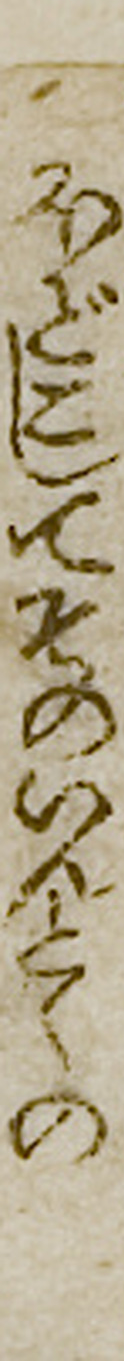ほどこしてそのいんとくの
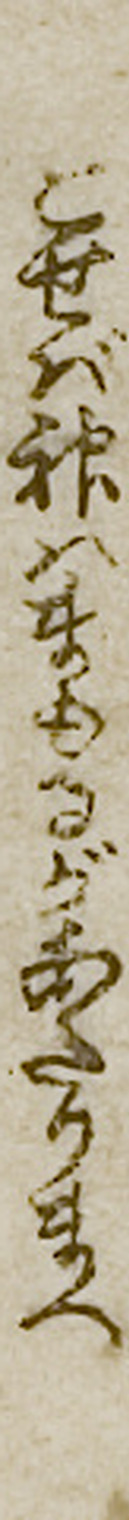こせば神はまもるがあたりまへ
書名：[福助・恵比寿・大黒・閻魔の子 福神長者を諭す]
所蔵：東京大学総合図書館 General Library in the University of Tokyo, JAPAN
